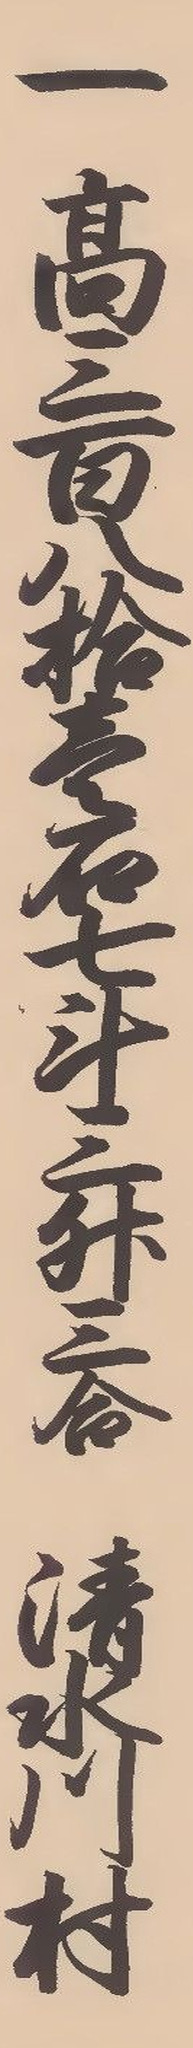一高三百八拾壱石七斗三升三合清水川村
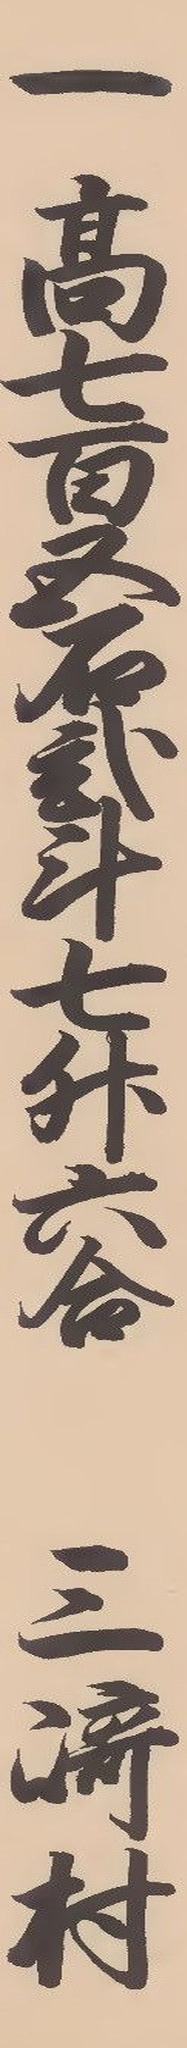一高七百五石弐斗七升六合三崎村
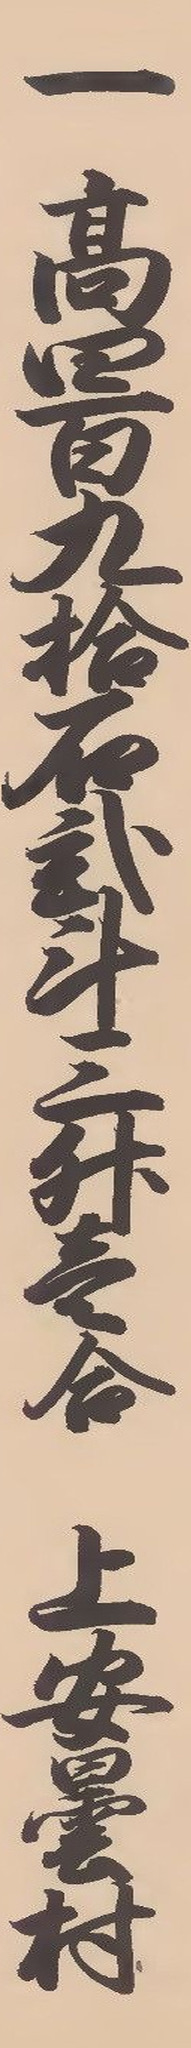一高四百九拾石弐斗三升壱合上安曇村
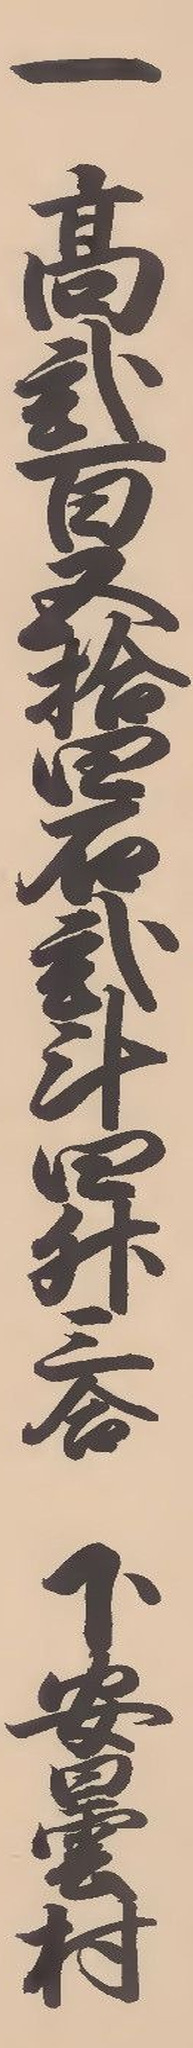一高弐百五拾四石弐斗四升三合下安曇村
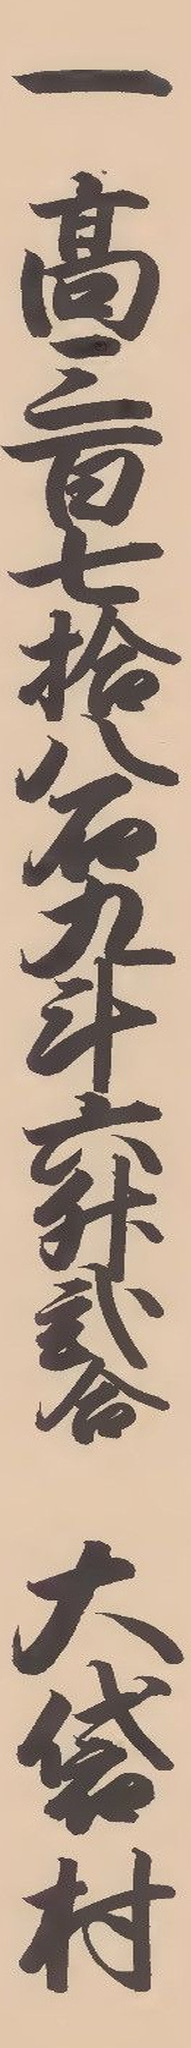一高三百七拾八石九斗六升弐合大袋村
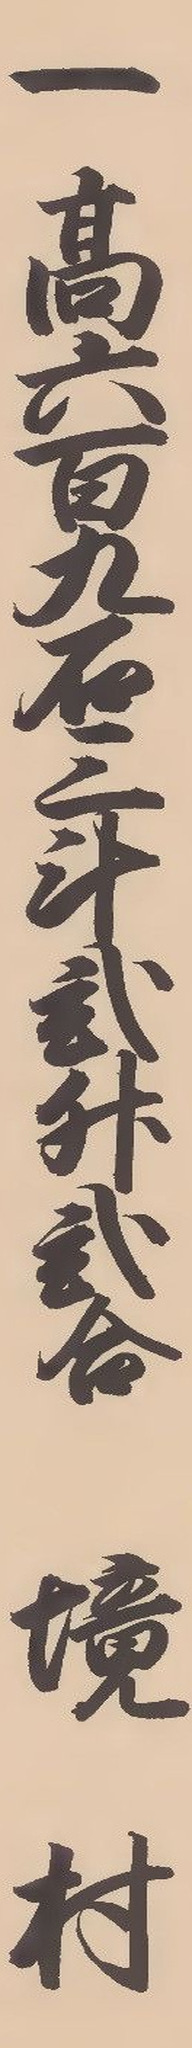一高六百九石三斗弐升弐合境村
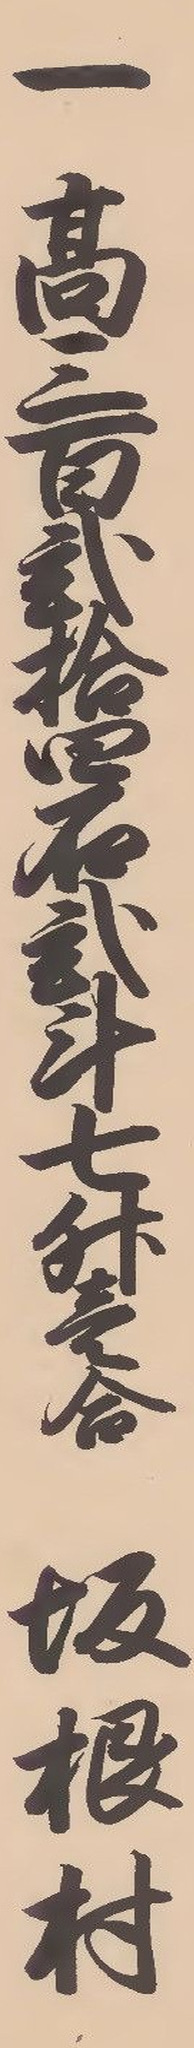一高三百弐拾四石弐斗七升壱合坂根村

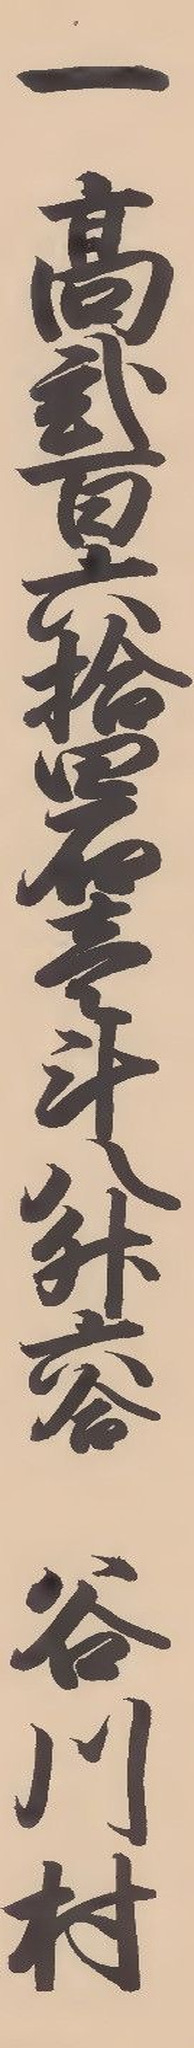一高弐百六拾四石壱斗八升六合谷川村
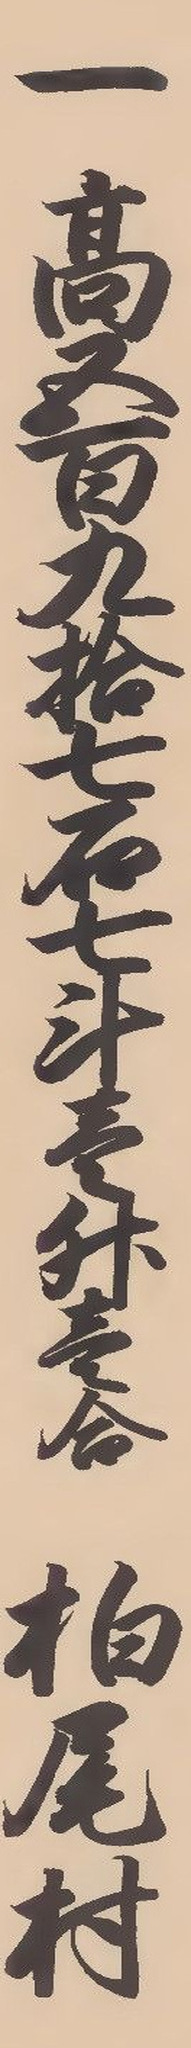一高五百九拾七石七斗壱升壱合柏尾村
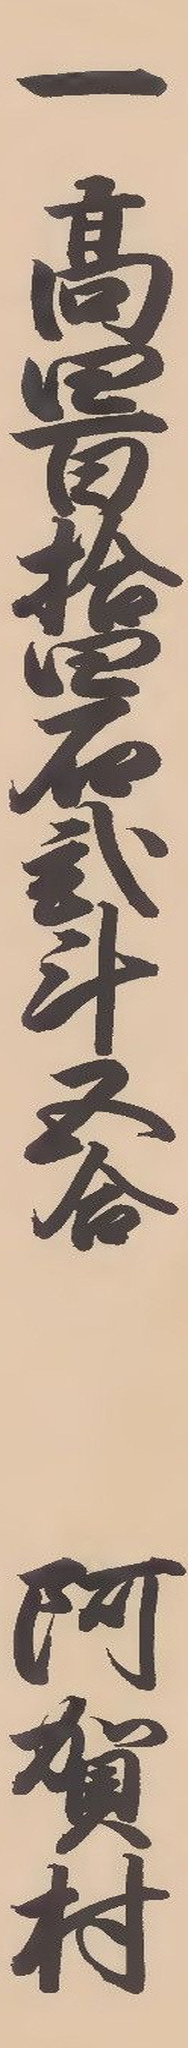一高四百拾四石弐斗五合阿賀村
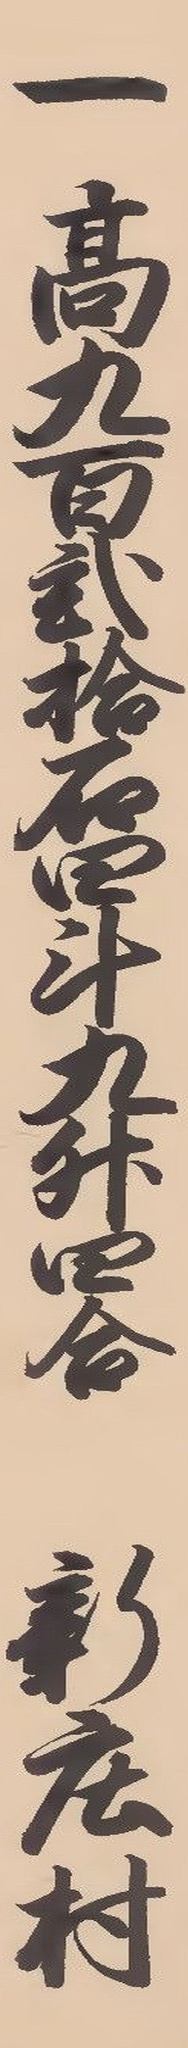一高九百弐拾石四斗九升四合新庄村
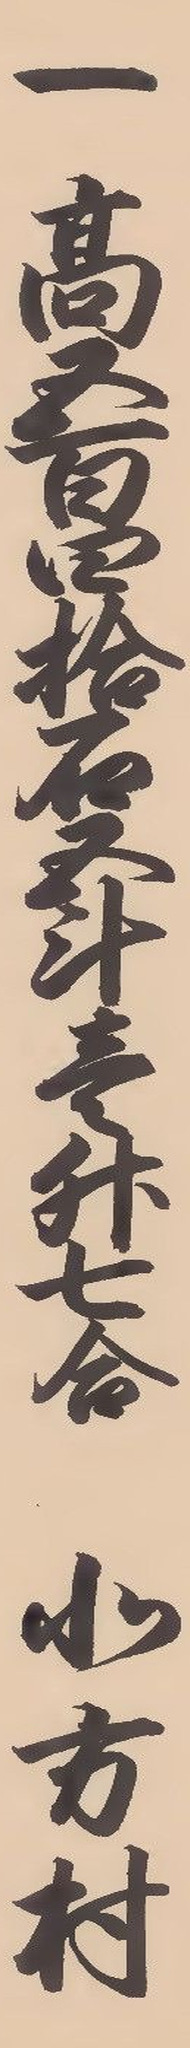一高五百四拾石五斗壱升七合北方村
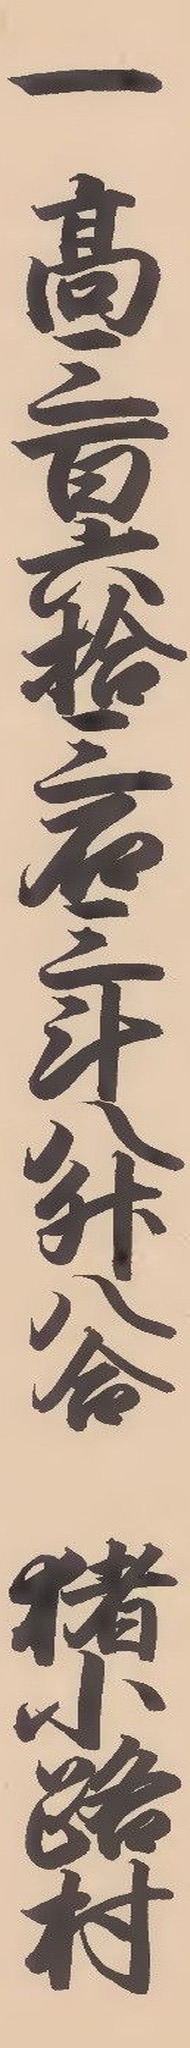一高三百六拾三石三斗八升八合猪小路村
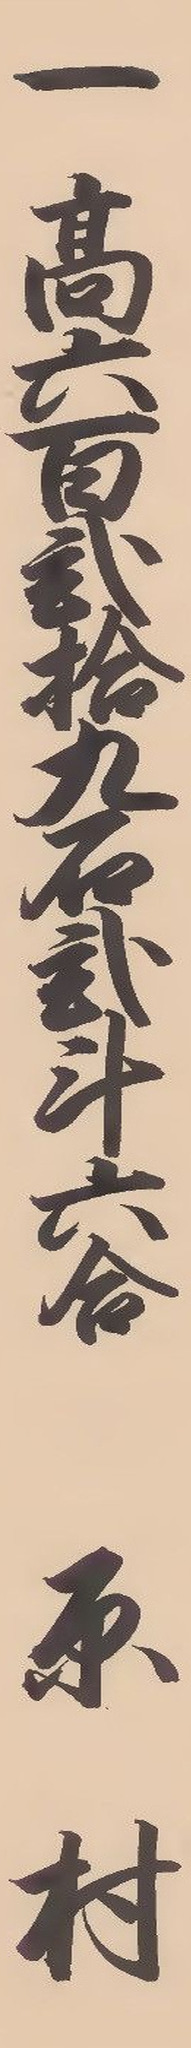一高六百弐拾九石弐斗六合原村

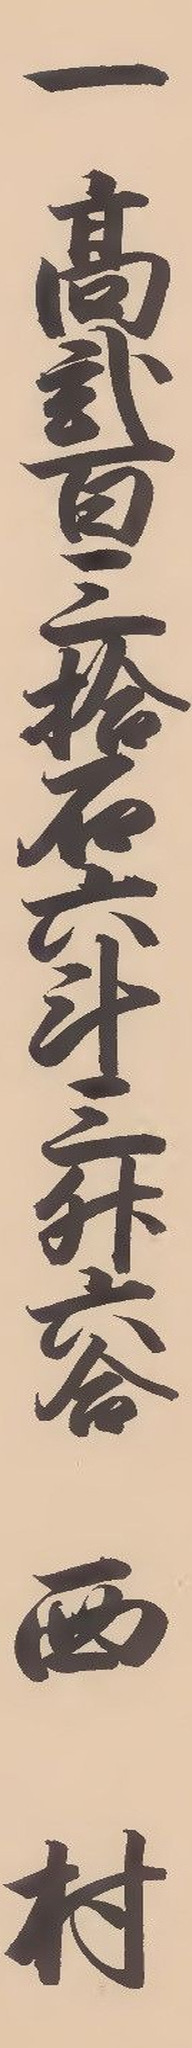一高弐百三拾石六斗三升六合西村
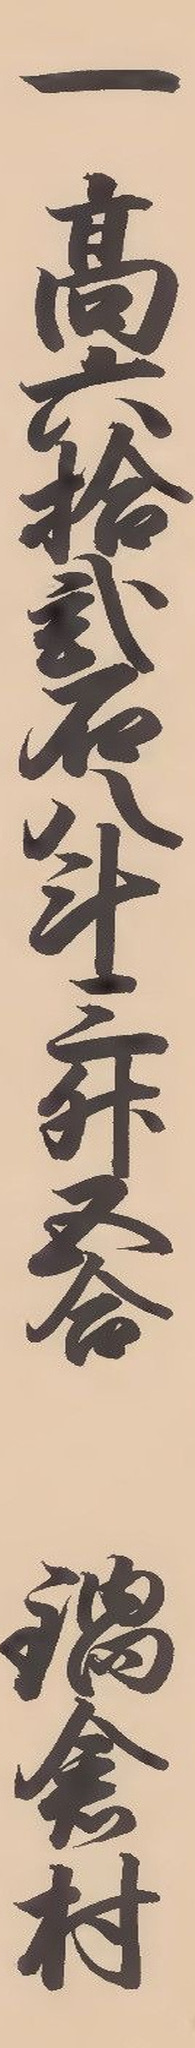一高六拾弐石八斗三升五合鍋倉村
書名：伯耆国郷帳
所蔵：国立公文書館 National Archives of Japan
